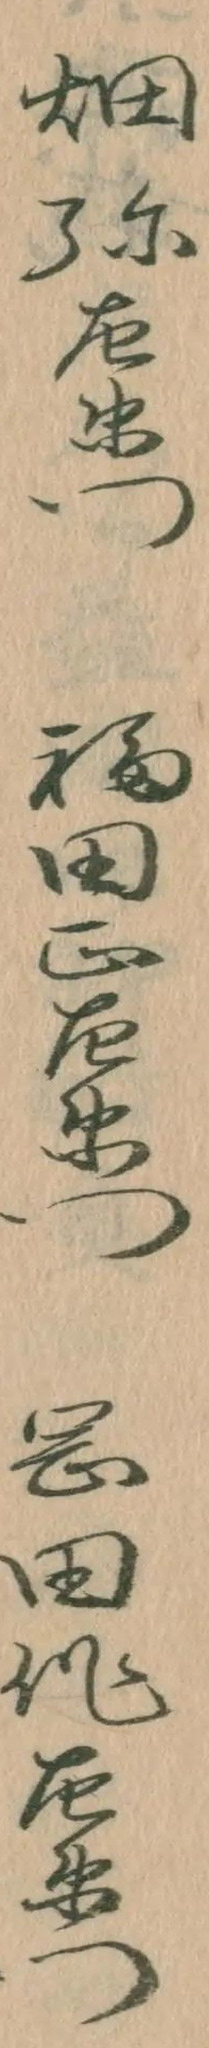畑弥左衛門福田正左衛門岡田作左衛門
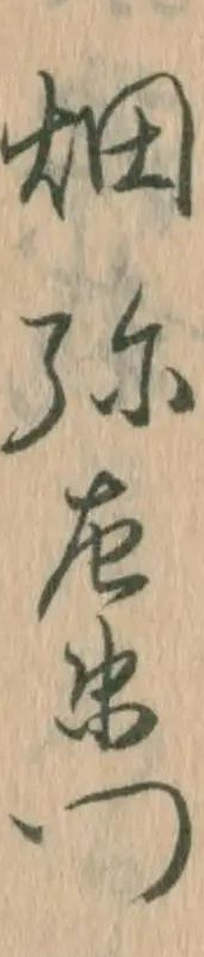関善左衛門
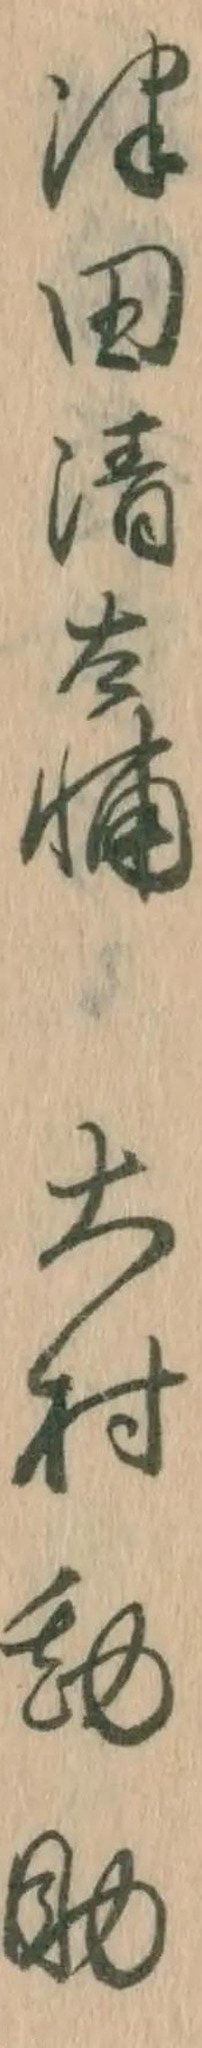津田清太輔大村勘助
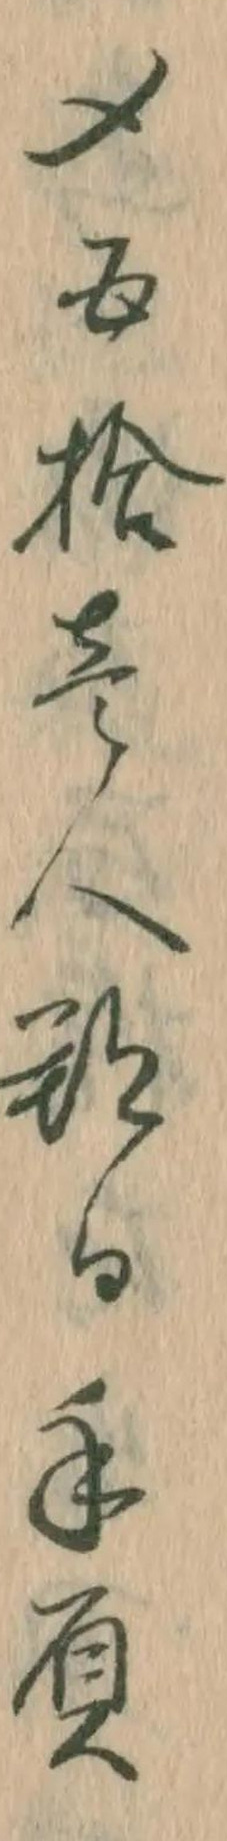〆五拾壱人朔日手負
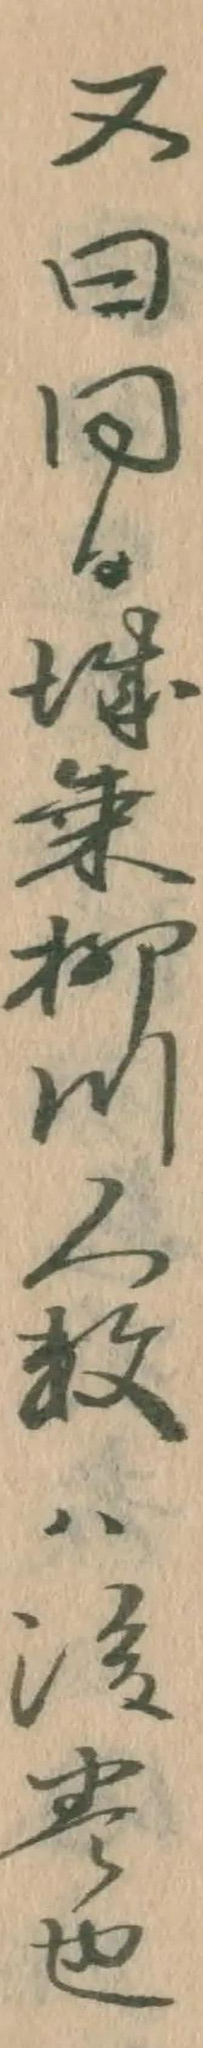又曰同日城乗柳川人数は後巻也
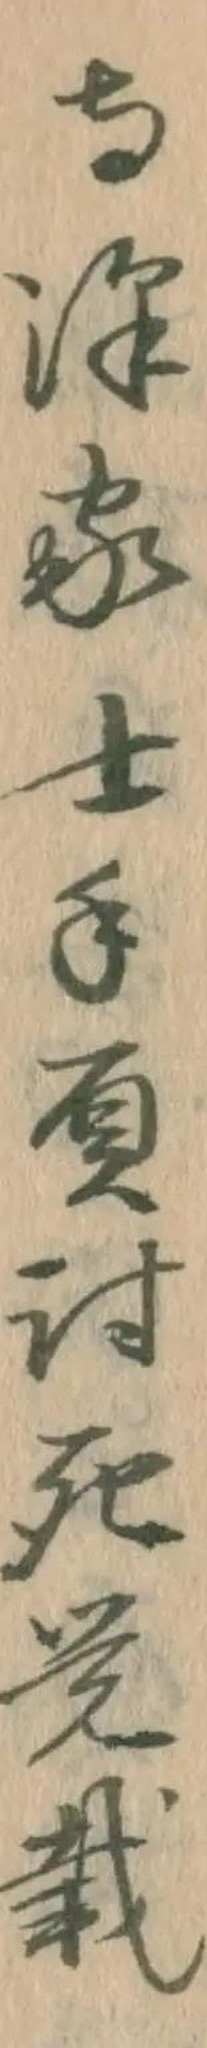寺沢家士手負討死覚載
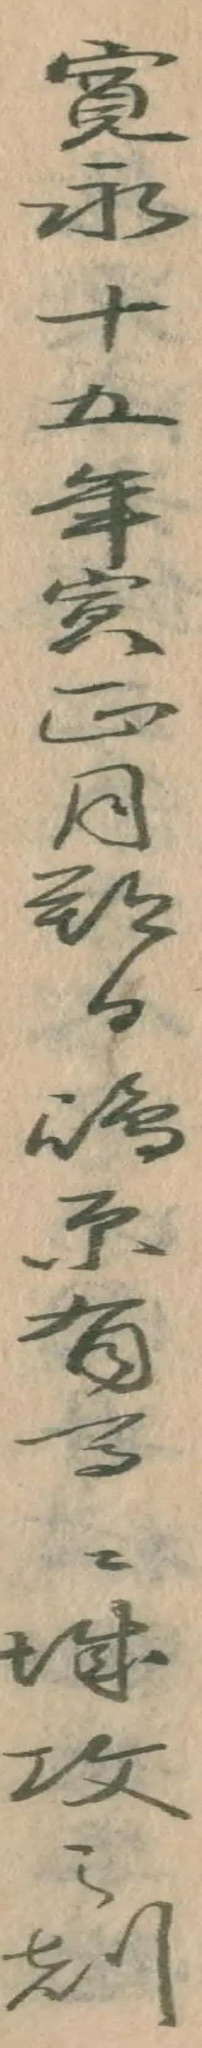寛永十五年寅正月朔日島原有馬に城攻之刻
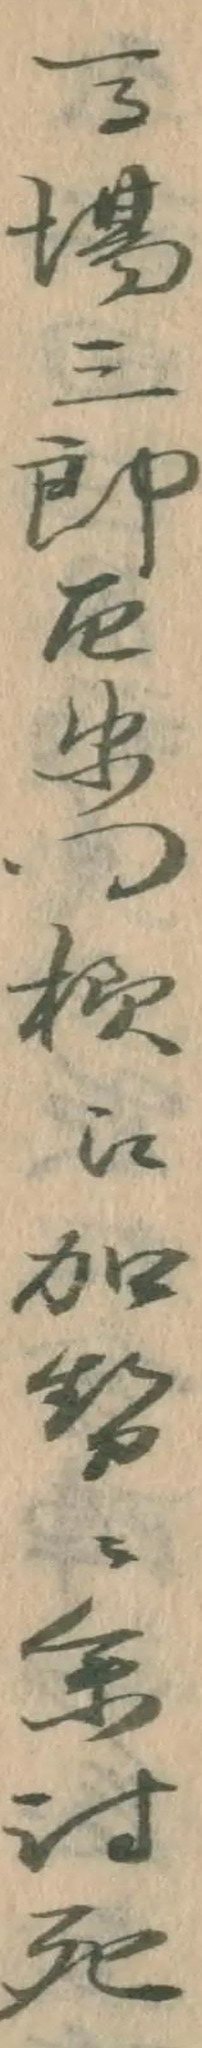馬場三郎左衛門様江加勢に参討死
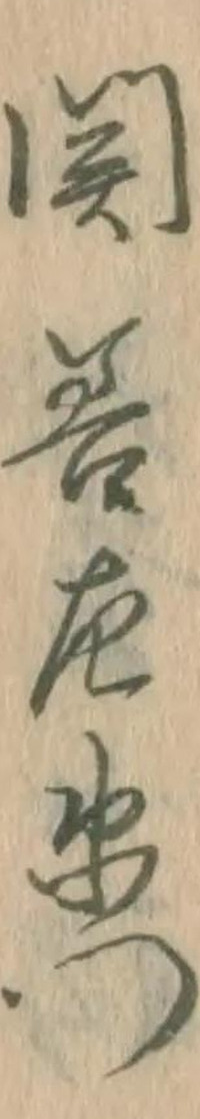関善左衛門
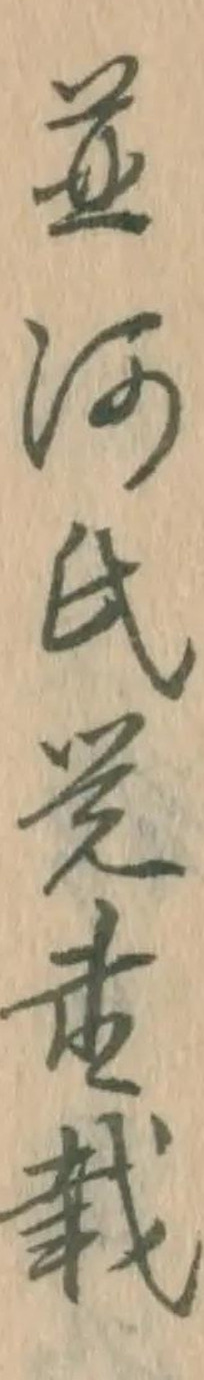並河氏覚書載
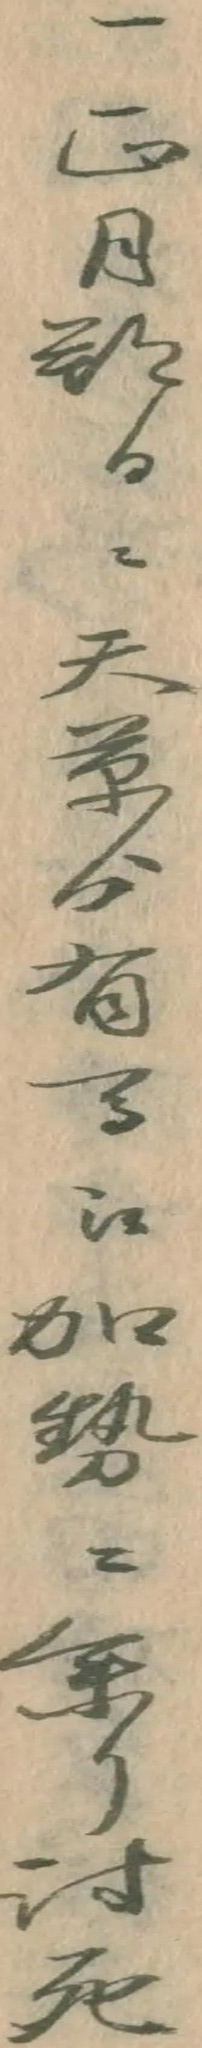一正月朔日に天草ゟ有馬江加勢に参り討死

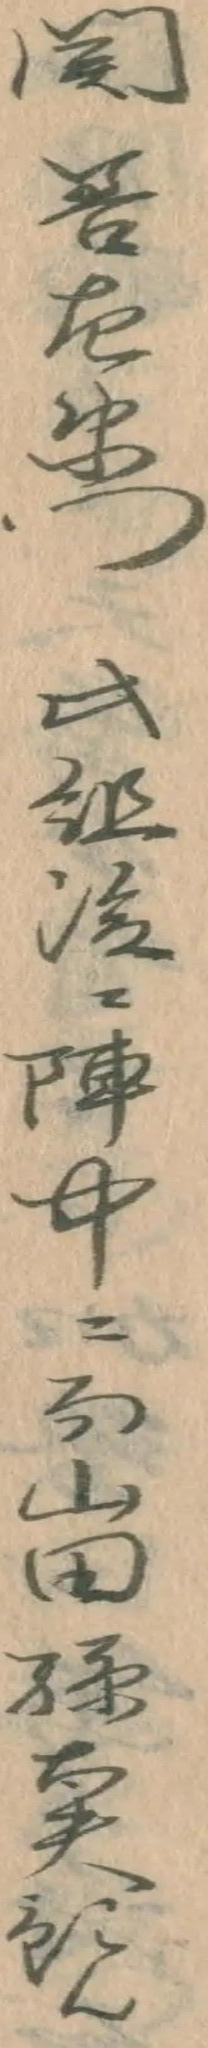関善左衛門此組後に陣中に而山田孫太夫預ん
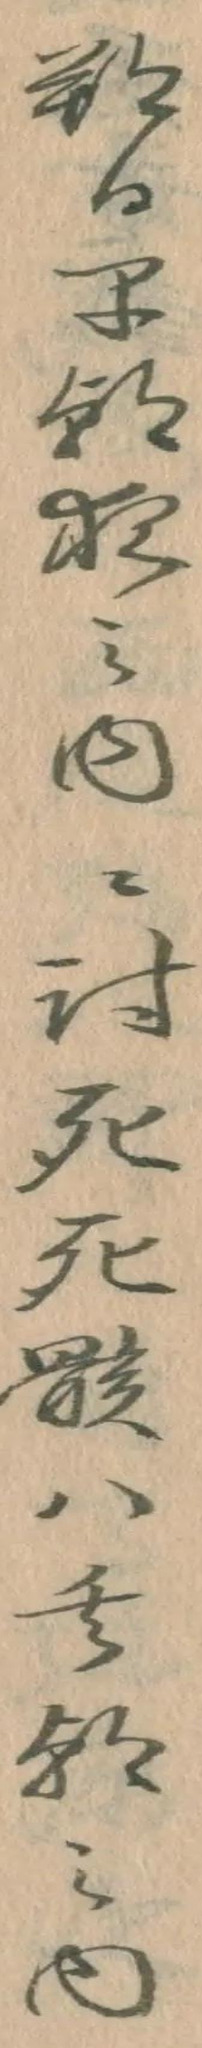朔日早朝夜之内に討死死骸は其朝之内
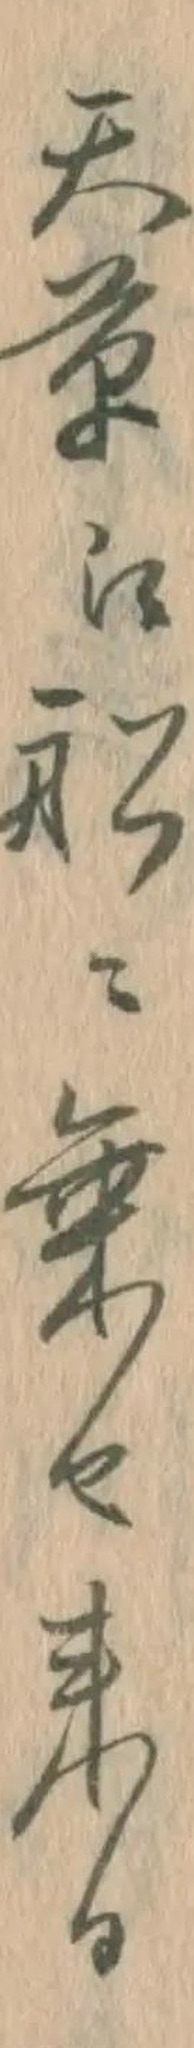天草江舩に乗せ来る
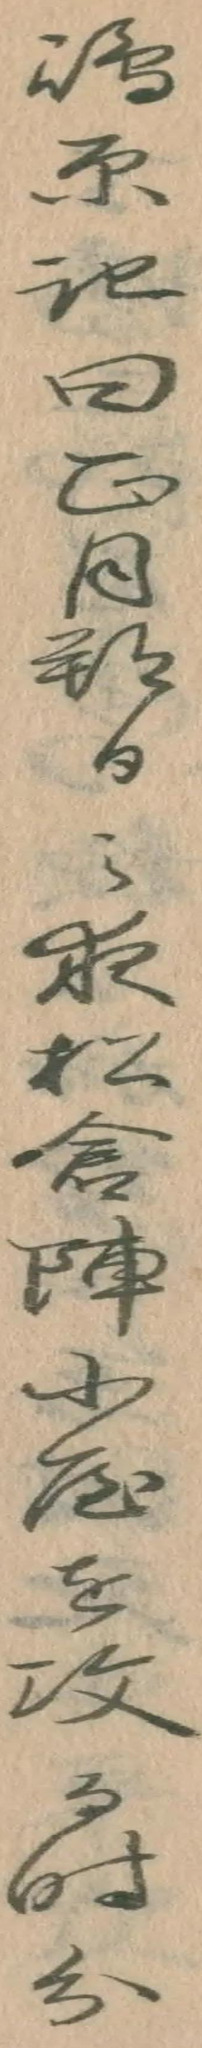島原記曰正月朔日之夜松倉陣小屋を攻る時分
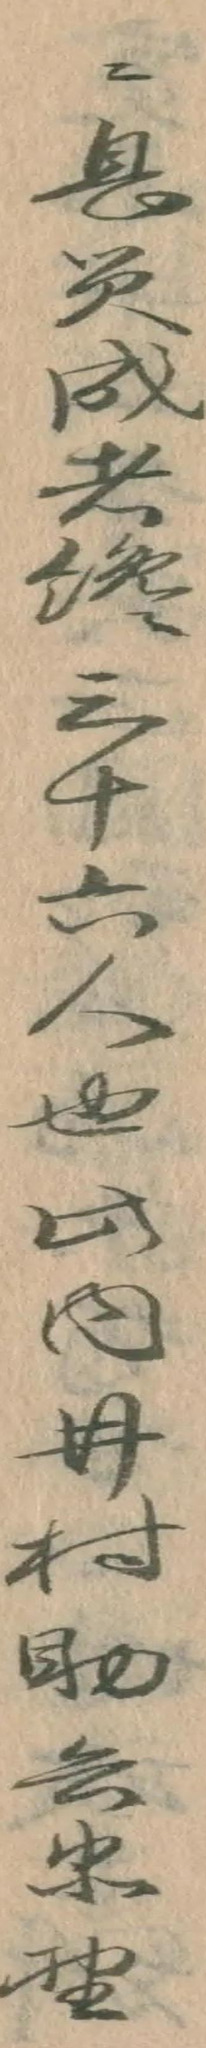に息災成者纔三十六人也此内井村助兵衛野
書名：切支丹御退治記 49巻. [5]
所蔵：国立国会図書館 National Diet Library, JAPAN
